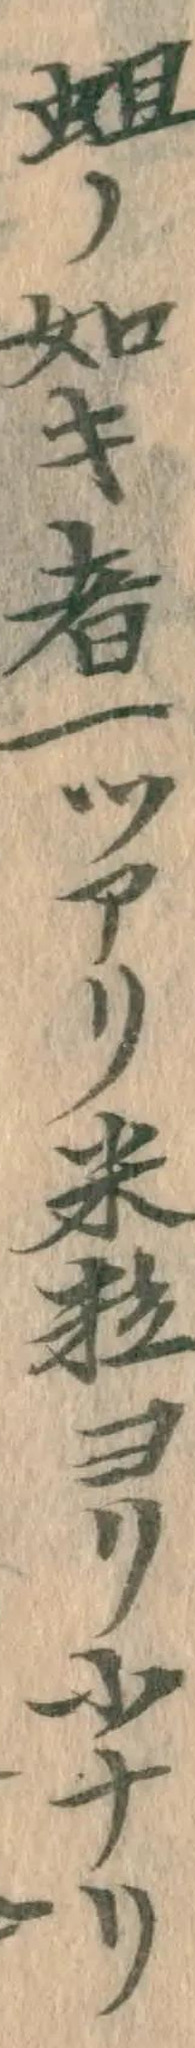蛆ノ如キ者一ツアリ米粒ヨリ少ナク
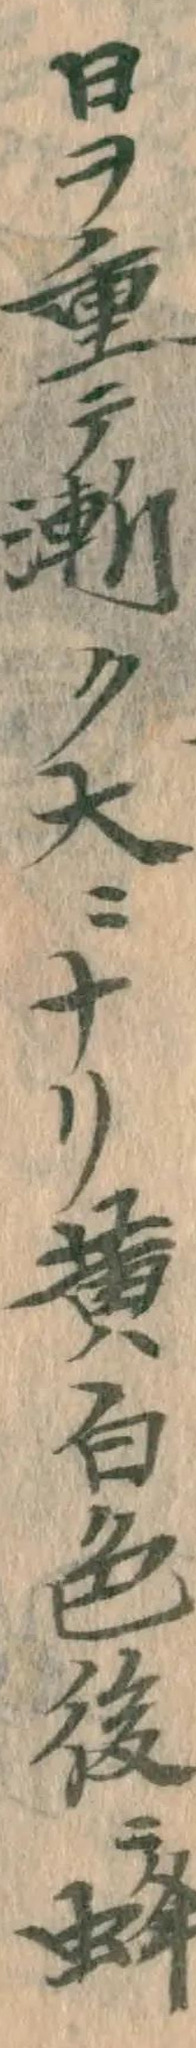日ヲ重テ漸ク大ニナリ黄白色後ニ蜂
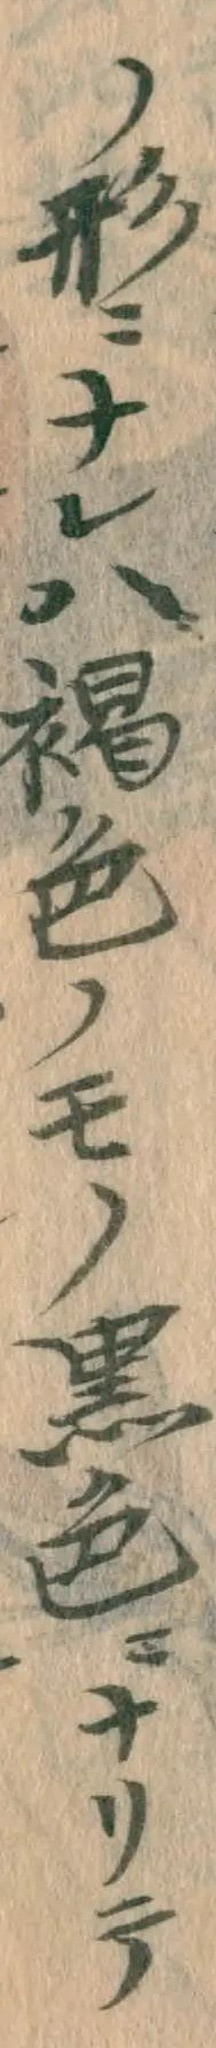ノ形ニナレハ褐色ノモノ黒色ニナリテ
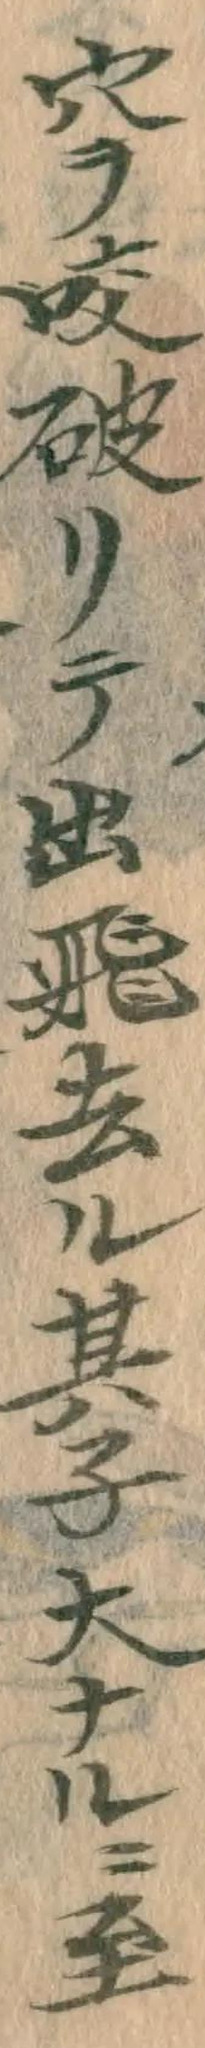穴ヲ咬破リテ出飛去ル其子大ナルニ至
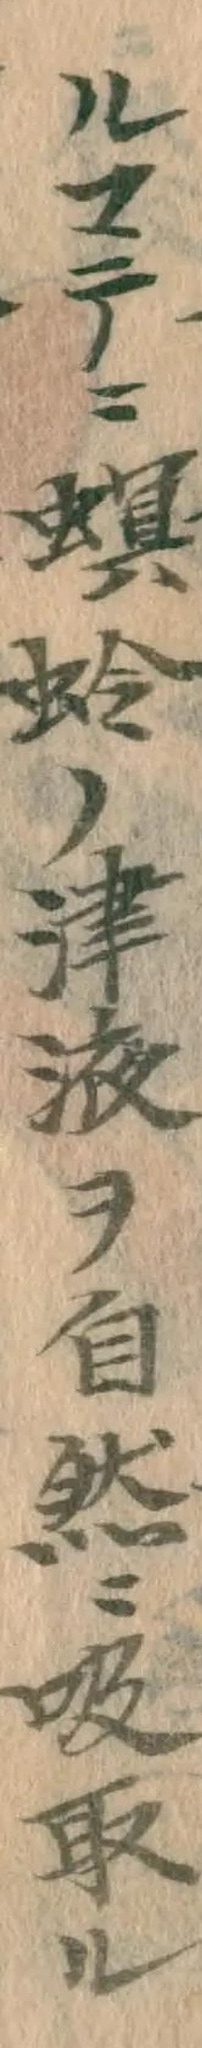ルマテニ螟蛉ノ津液ヲ自然ニ吸取ル
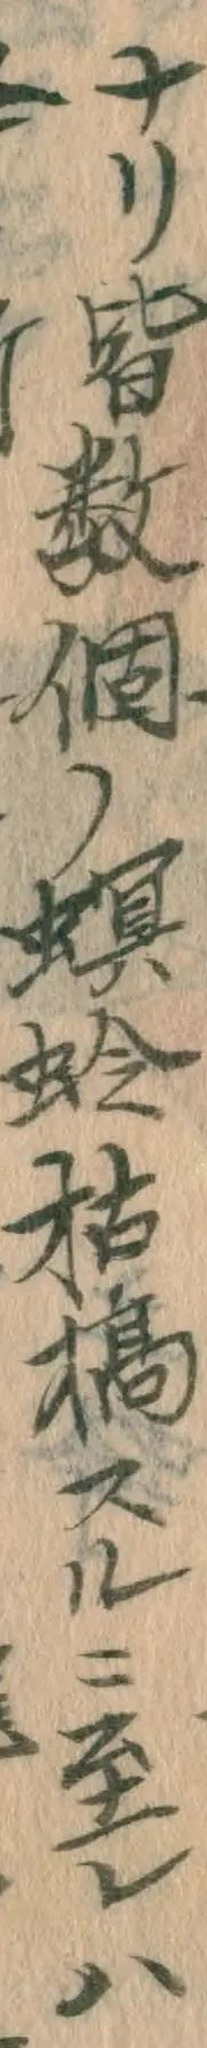ナリ皆数個ノ螟蛉枯槁スルニ至レハ
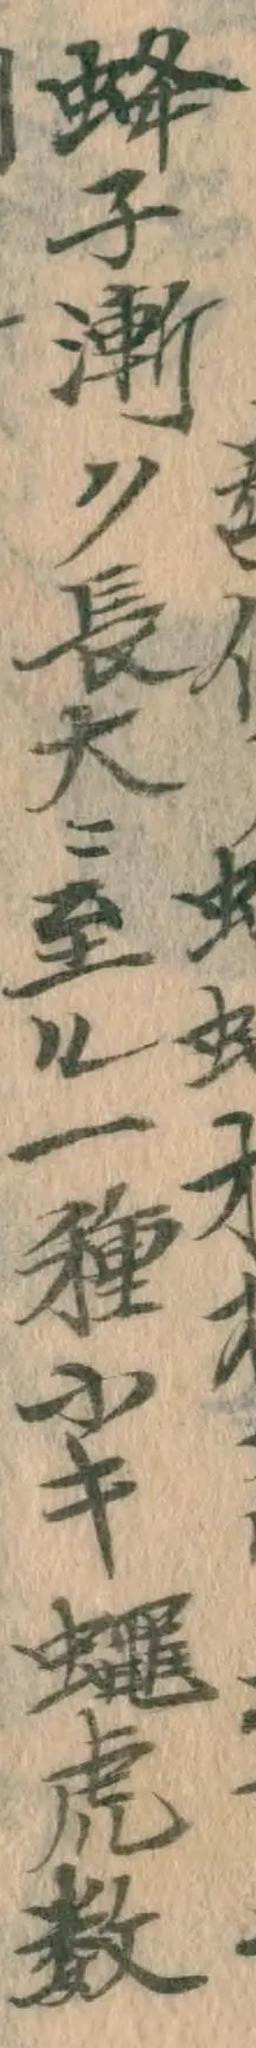蜂子漸ク長大ニ至ル一種小キ蝿虎数吮
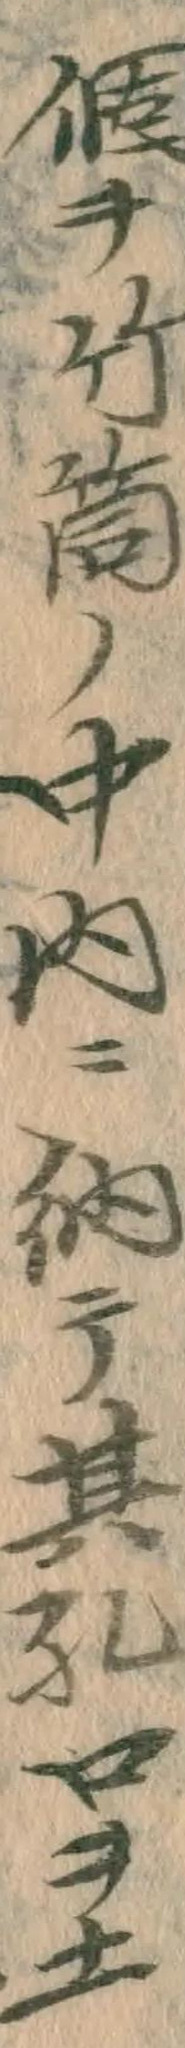個ヲ竹筒ノ中内ニ納テ其孔口ヲ土
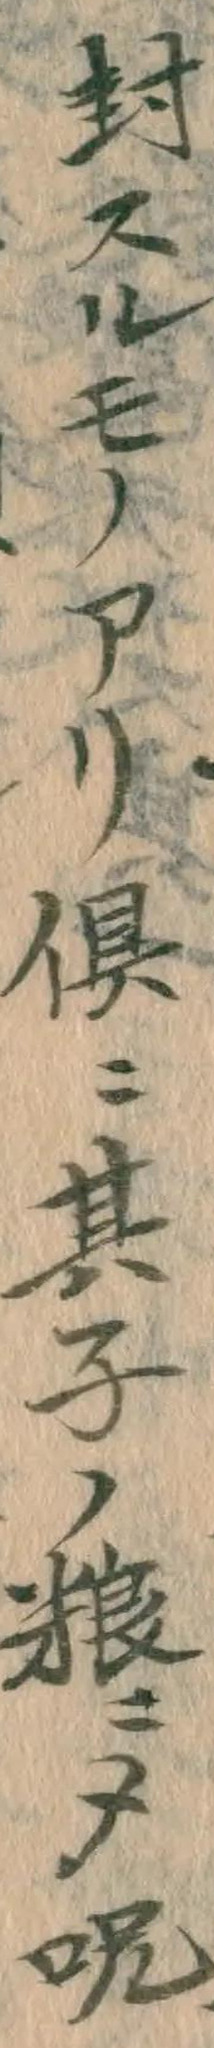封スルモノアリ倶ニ其子ノ粮ニシテ呪
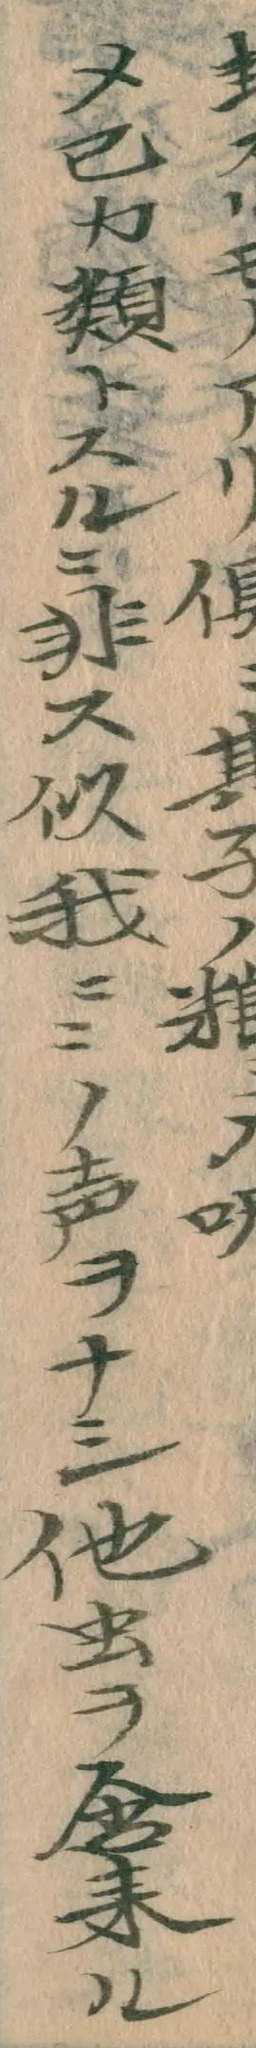シテ己カ類トスルニ非ス似我々々ノ声ヲナシ他虫ヲ含来ル
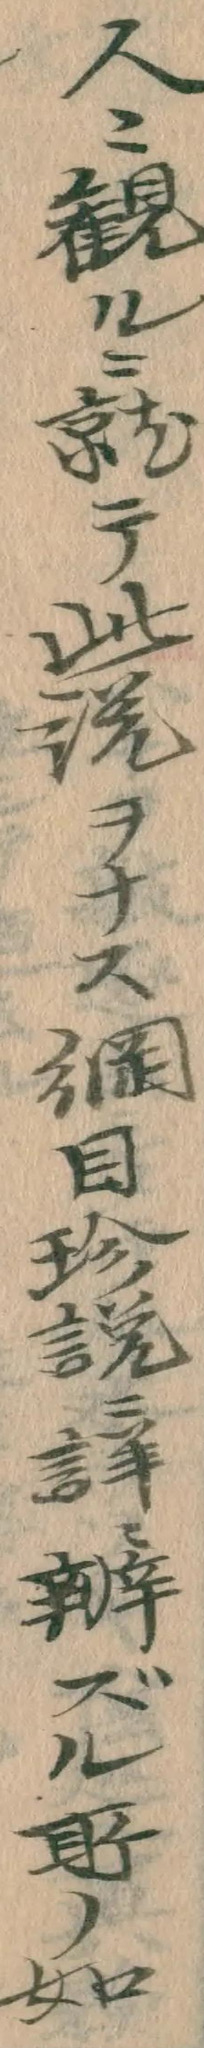人ニ観ルニ就テ此説ヲナス綱目珍説ニ詳ニ辨ズル所ノ如

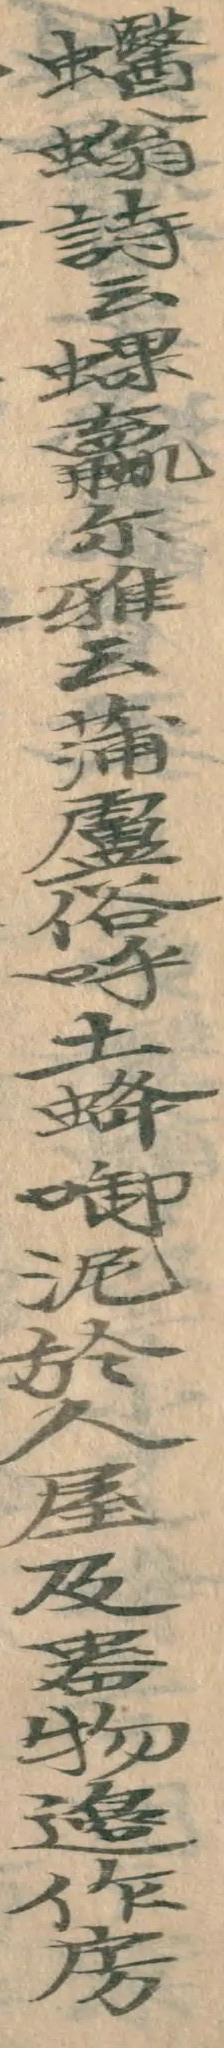螉詩云蜾臝尓雅云蒲盧俗呼土蜂啣泥於人屋及器物偏邉作房
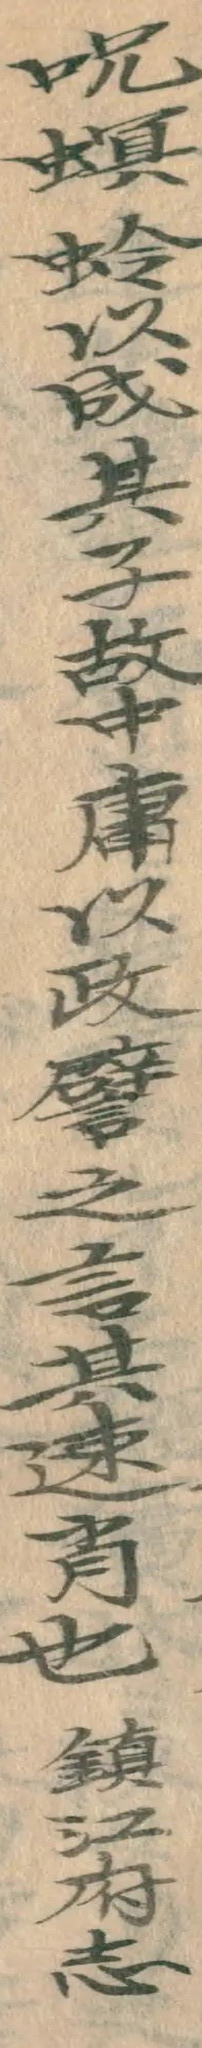呪螟蛉以成其子故中庸以政譬之言其速肖也鎮江府志
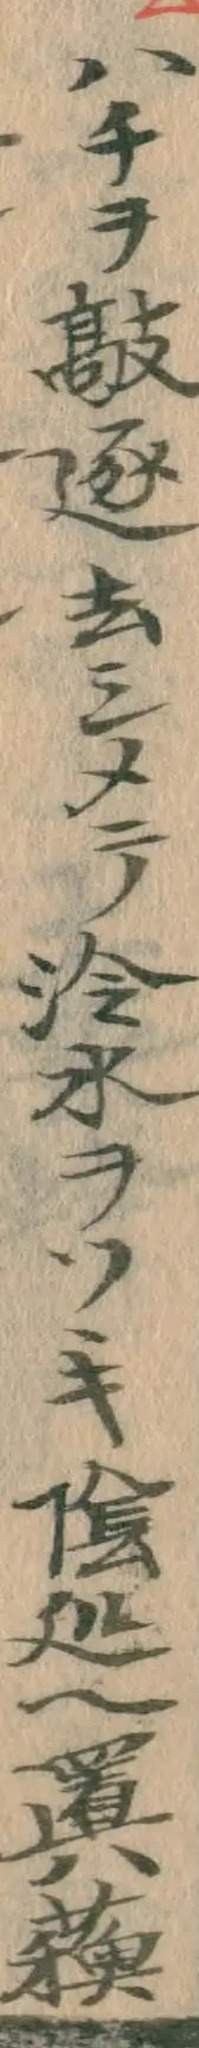△ハチヲ敲逐去シメテ冷水ヲソヽキ陰処ヘ置ハ蘓
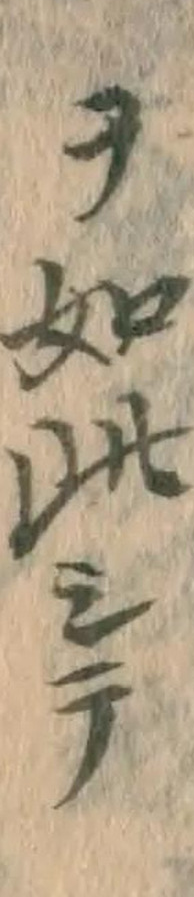ヲ如此シテ
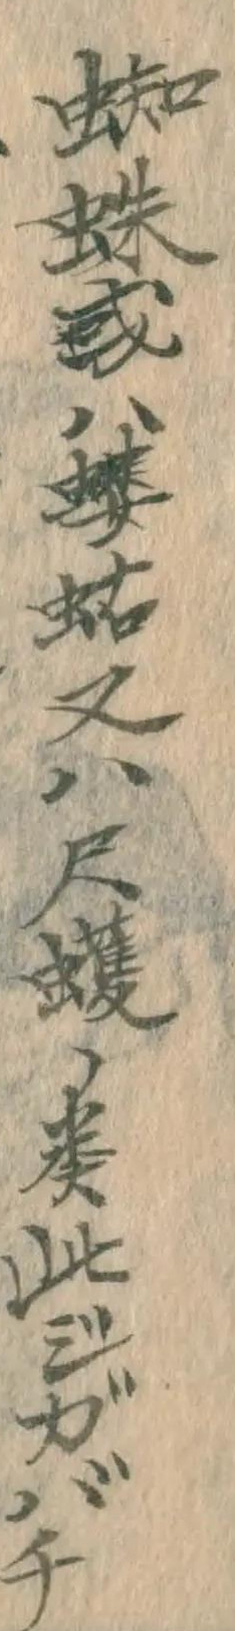蜘蛛或ハ螻蛄又ハ尺蠖ノ此ジガバチ
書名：千蟲譜 3巻. [2]
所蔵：国立国会図書館 National Diet Library, JAPAN
